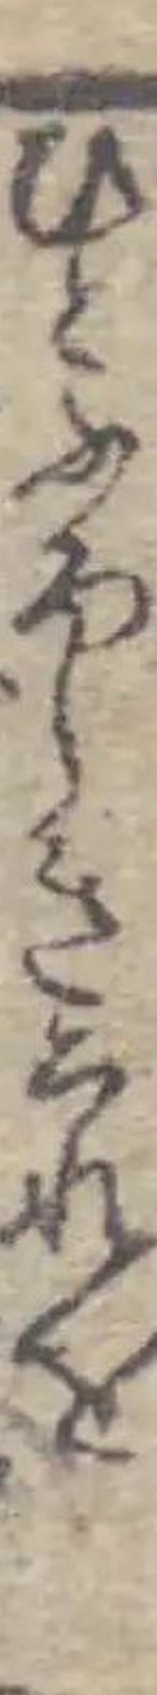ひとふろしきこれを
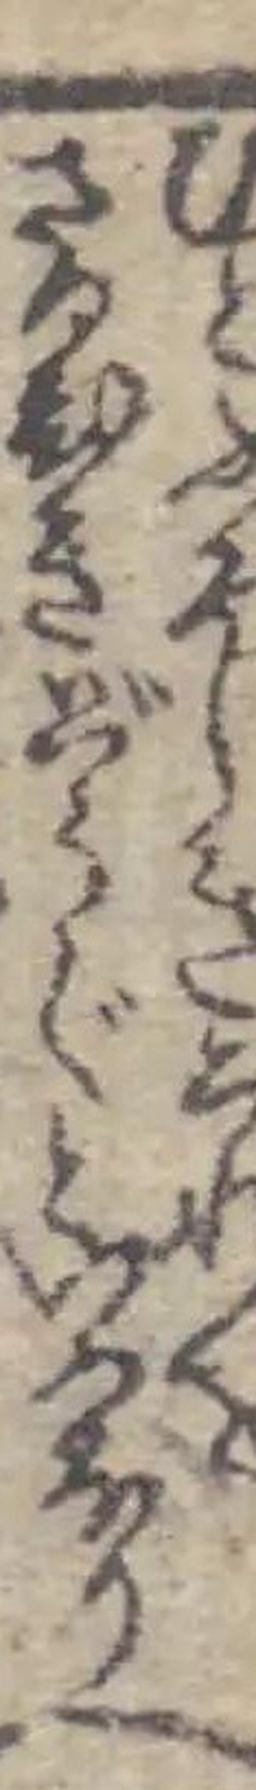さるひきどうぐといふなり
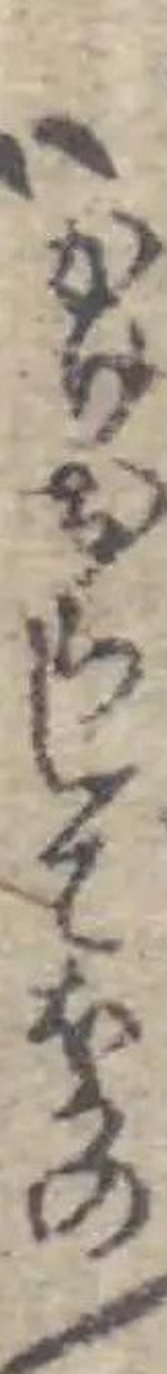かけおちしてほかの
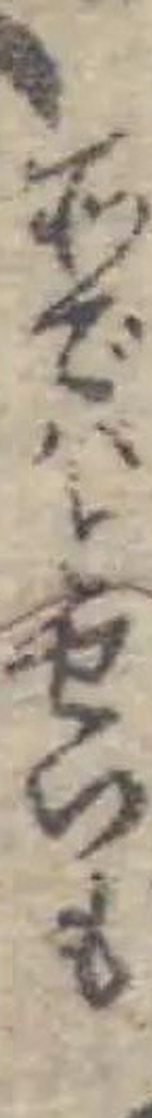所ではとせいも
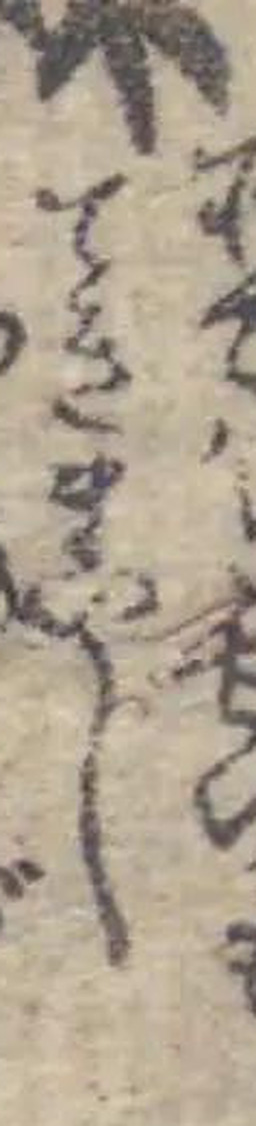てきまいし
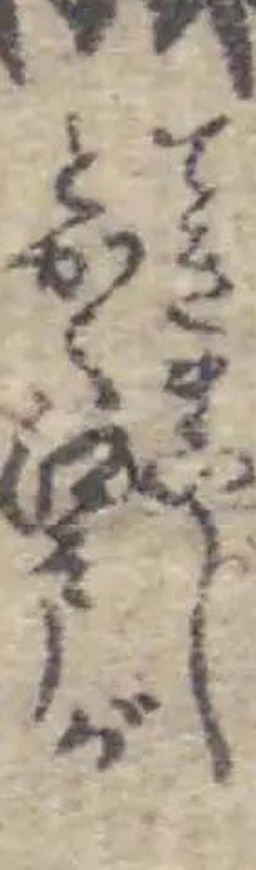とかく江戸が
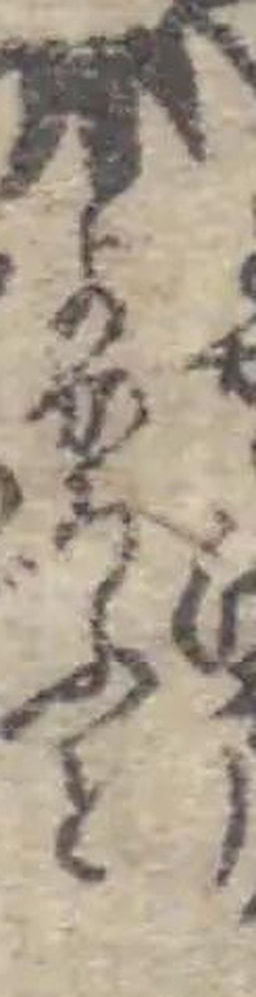よかろふと
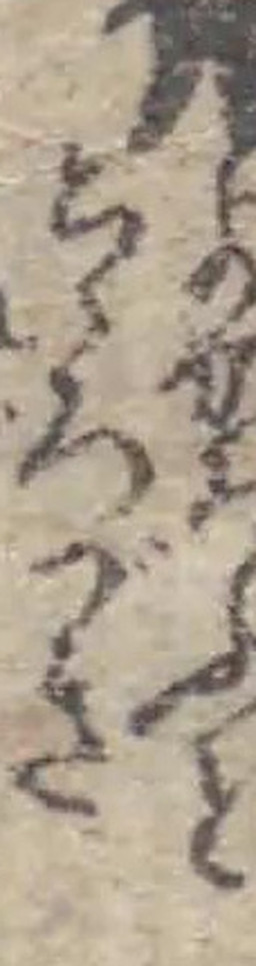こゝろづき
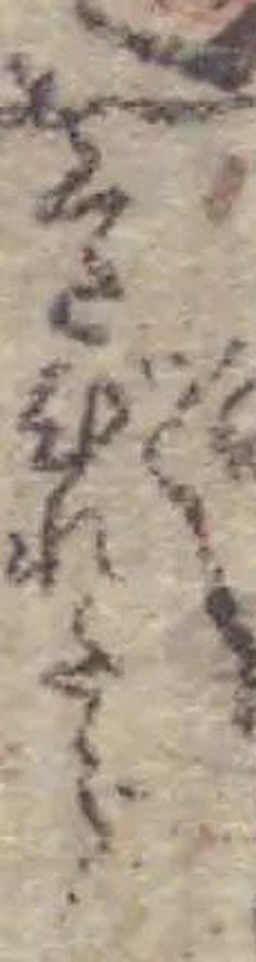くたびれたら
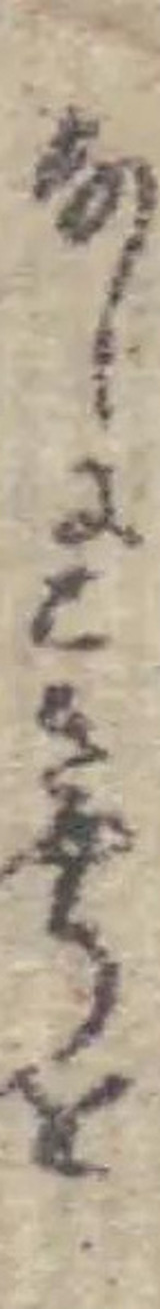なしにこきやうを
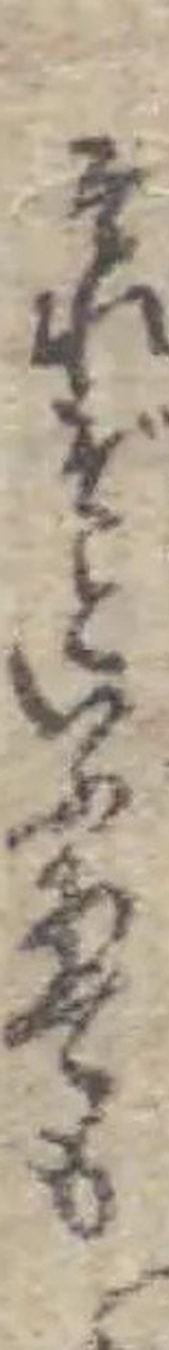それぞといふあても
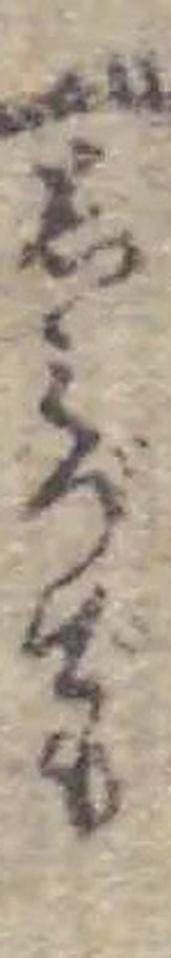しみづでも
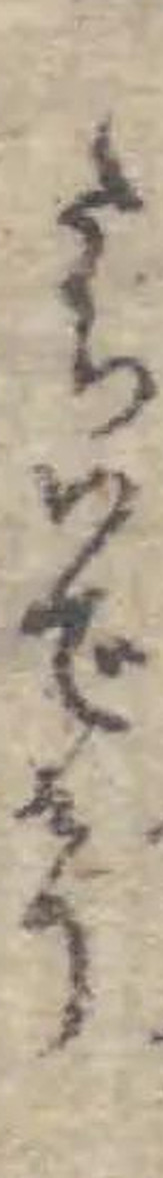たちいでけり
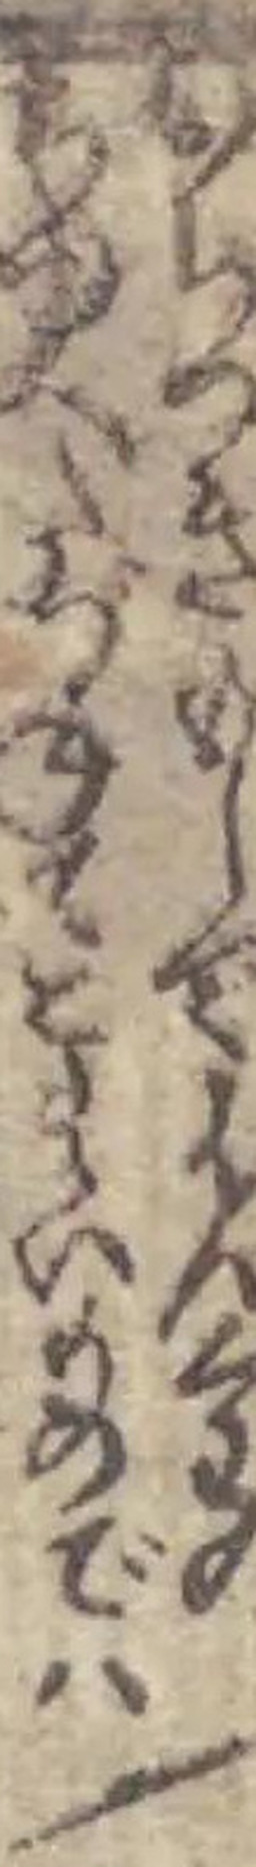ちゆへたづねてこまいものでは
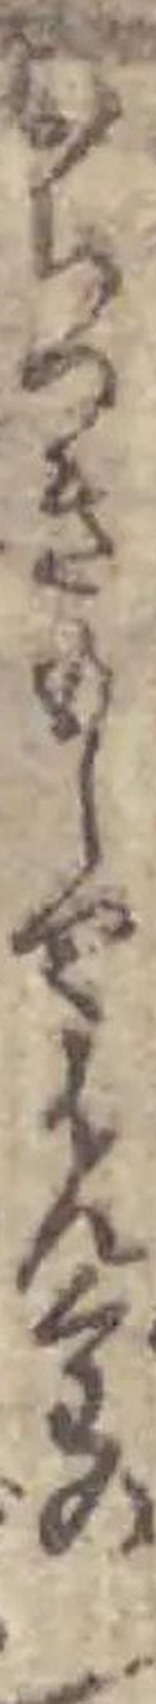おちつきもしやはんくわの
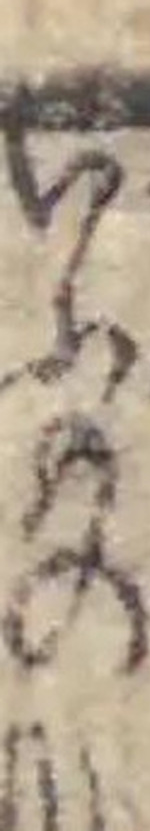いふもの
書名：蟹牛房挟多 3巻
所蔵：国立国会図書館 National Diet Library, JAPAN
